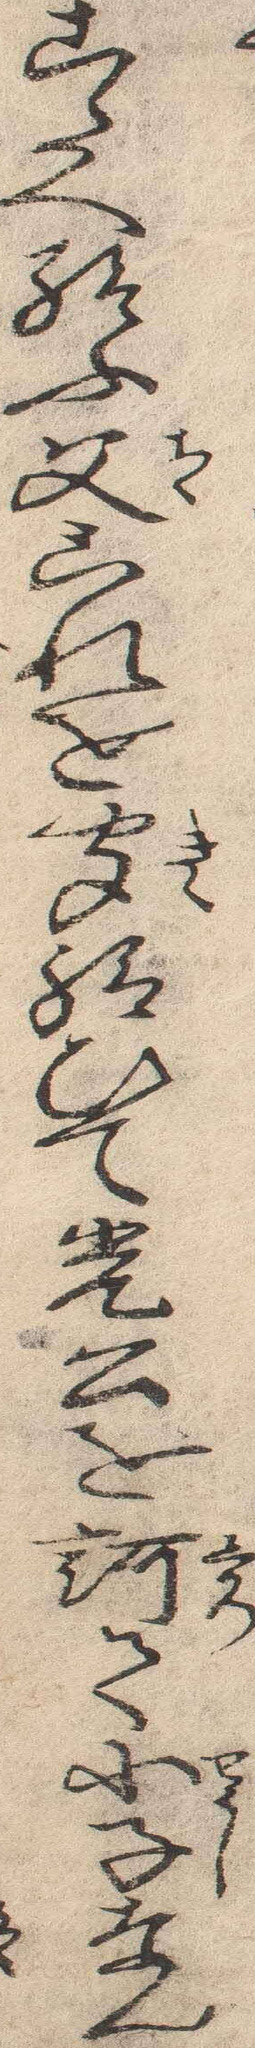こたへ給ふ父これを聞給ひて光公を訶て小子なん
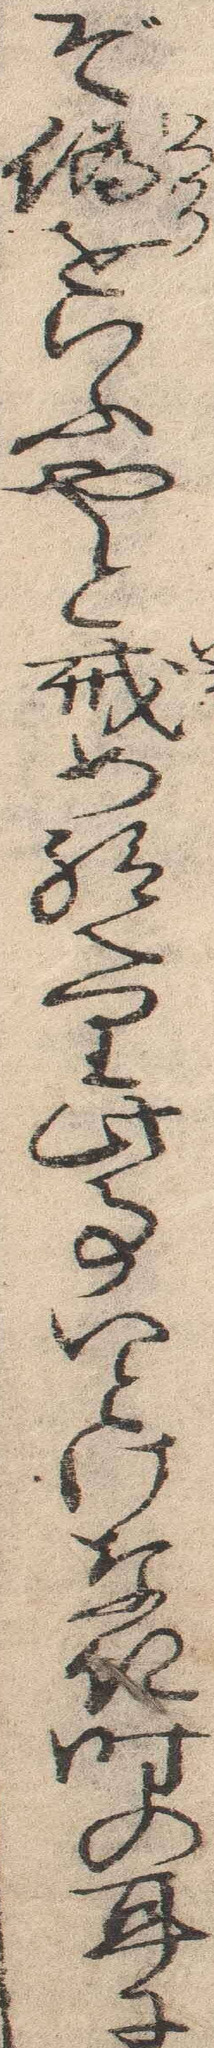ぞ偽をいふやと戒め給えり此事いとけなき時の耳に

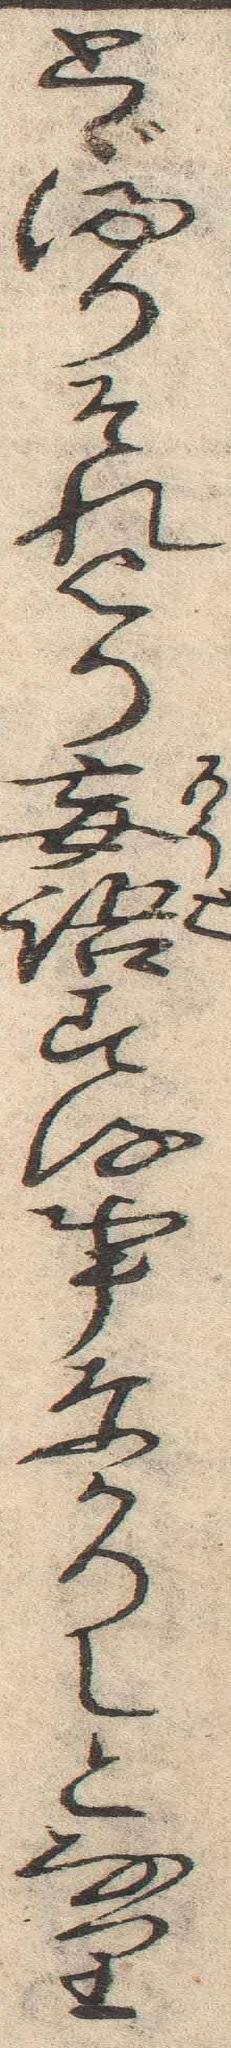とゞまりそれより妄語する事なかりしとなり
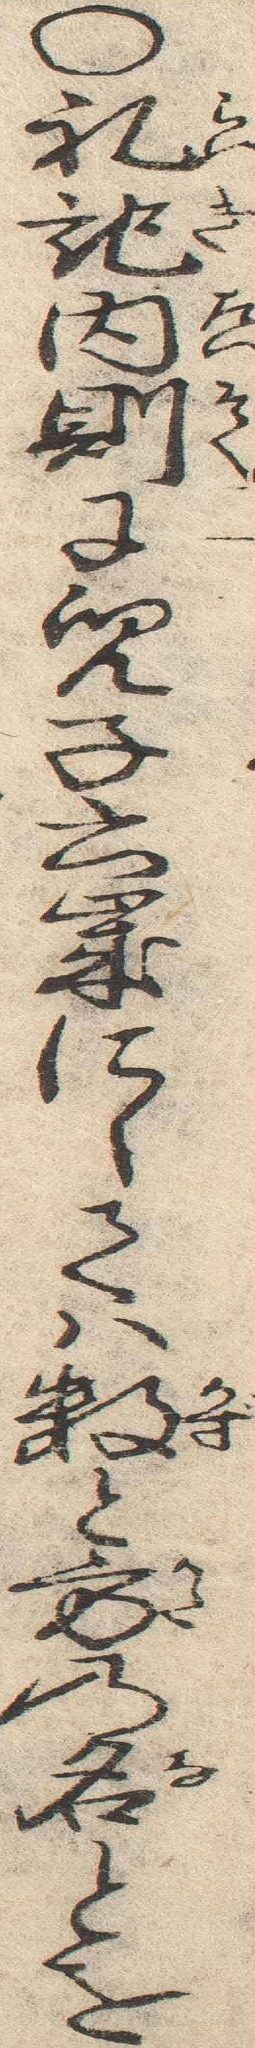○礼記内則に児子六歳にしては数と方の名とを
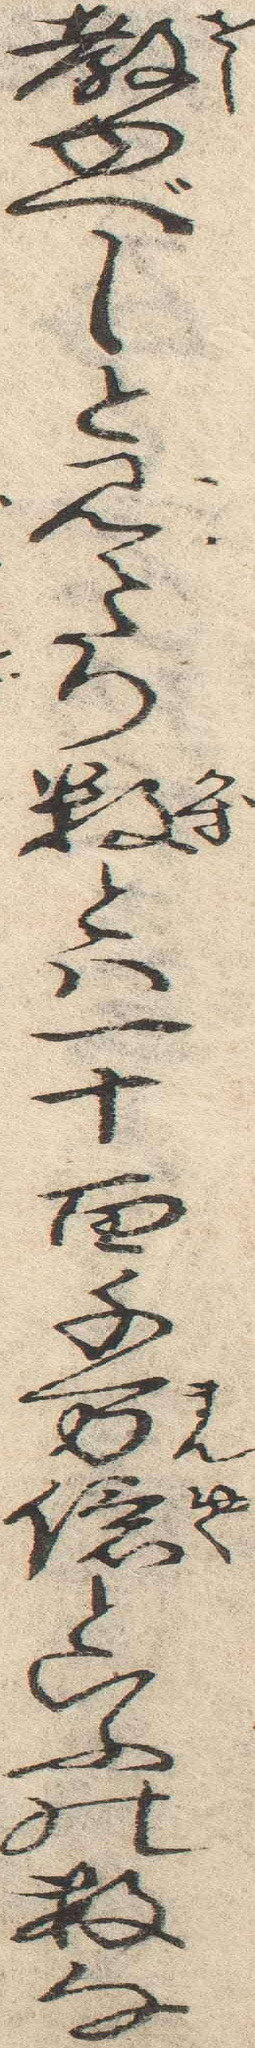教ゆべしと見えたり数とは一十百千万億といふの数な
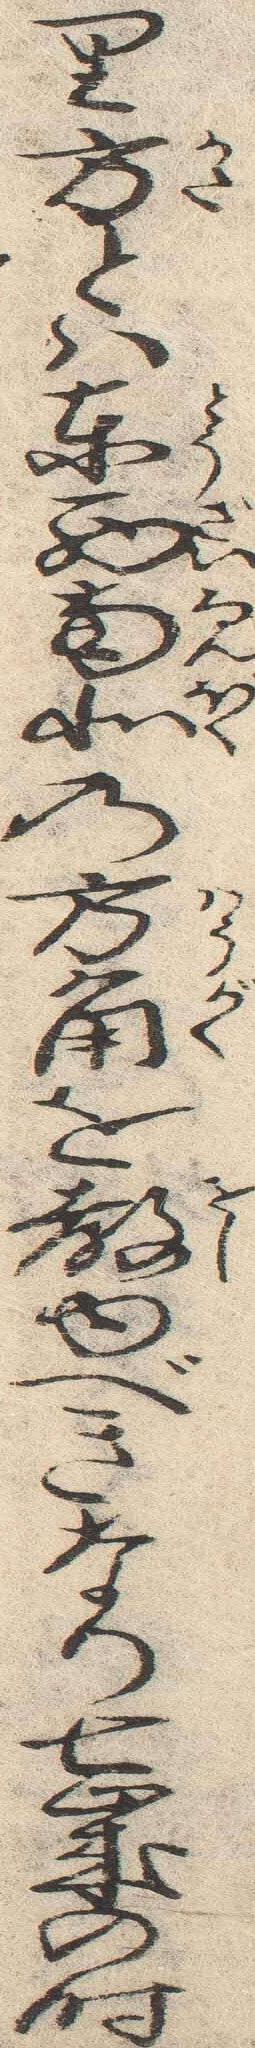り方とは東西南北の方角を教ゆべきなり七歳の時
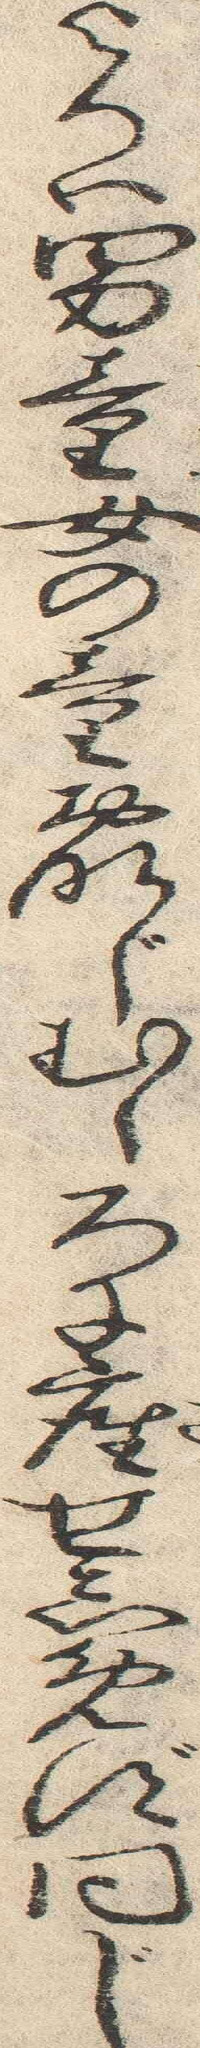よりは男童女の童おなじむしろに座せしめず同じ
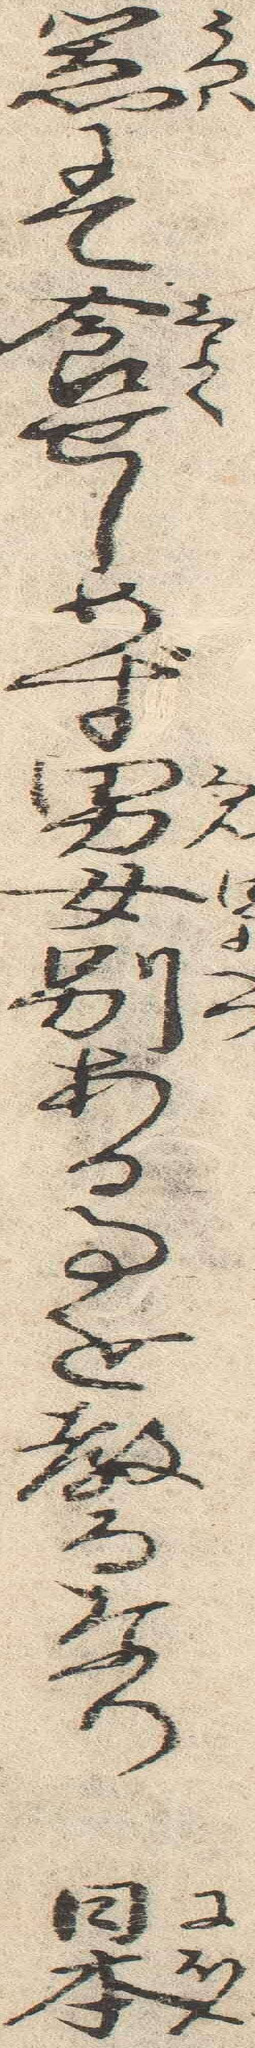器にて食せしめず男女別にある事を教るなり日本
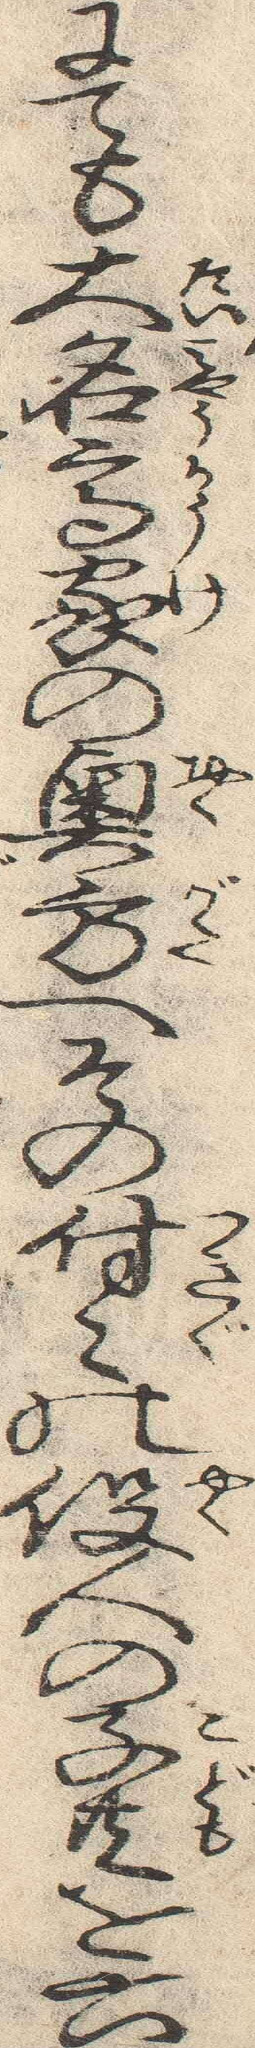にても大名髙家の奥方へその付々の役人の子共を六
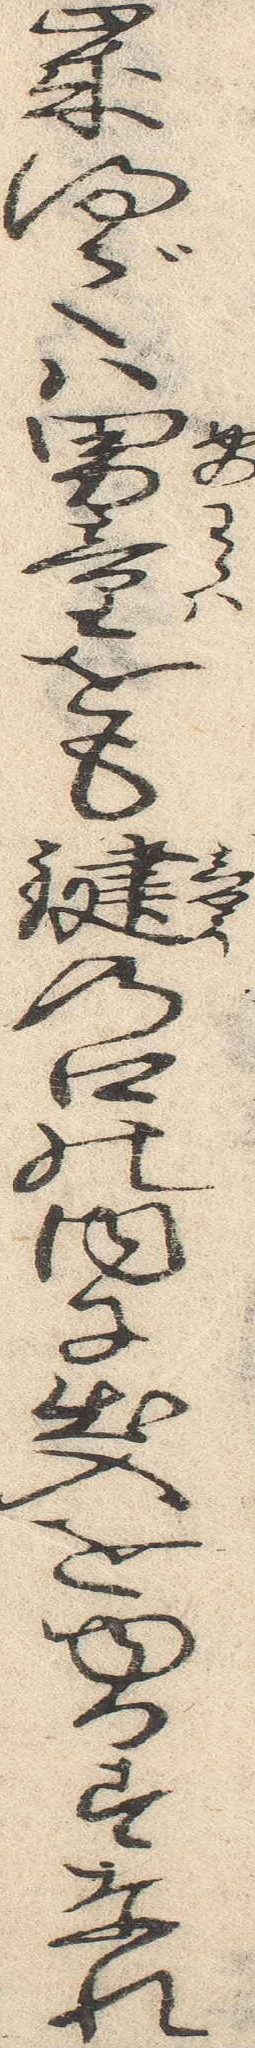歳までは男童をも鍵の口の内に出入をゆるすなれ
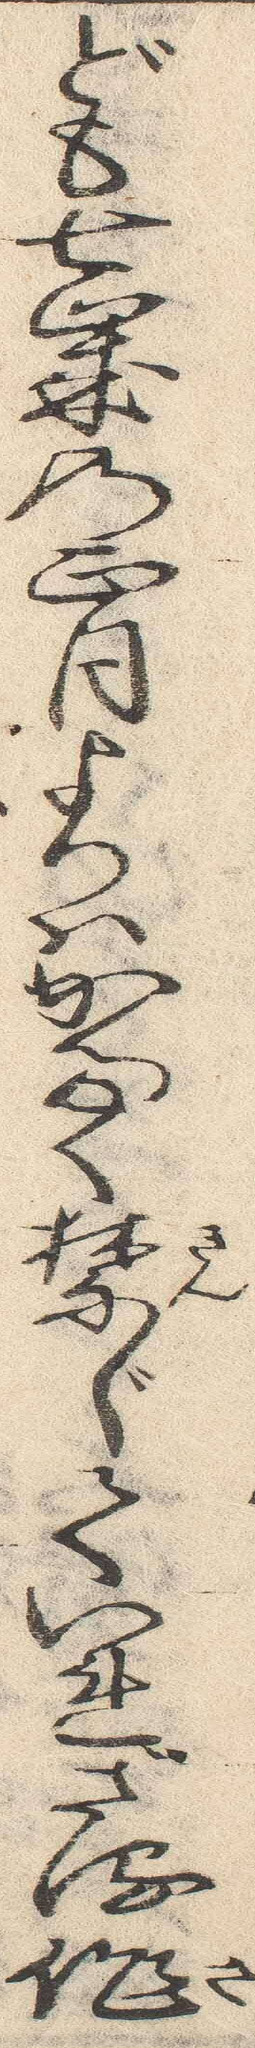ども七歳の正月よりはかたく禁じていれざる作
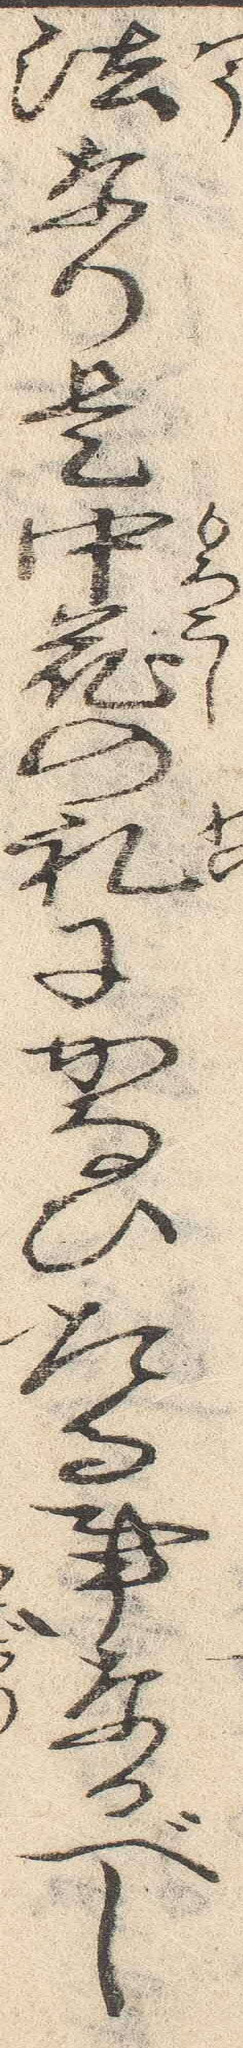法なり是中花の礼にかなひたる事なるべし
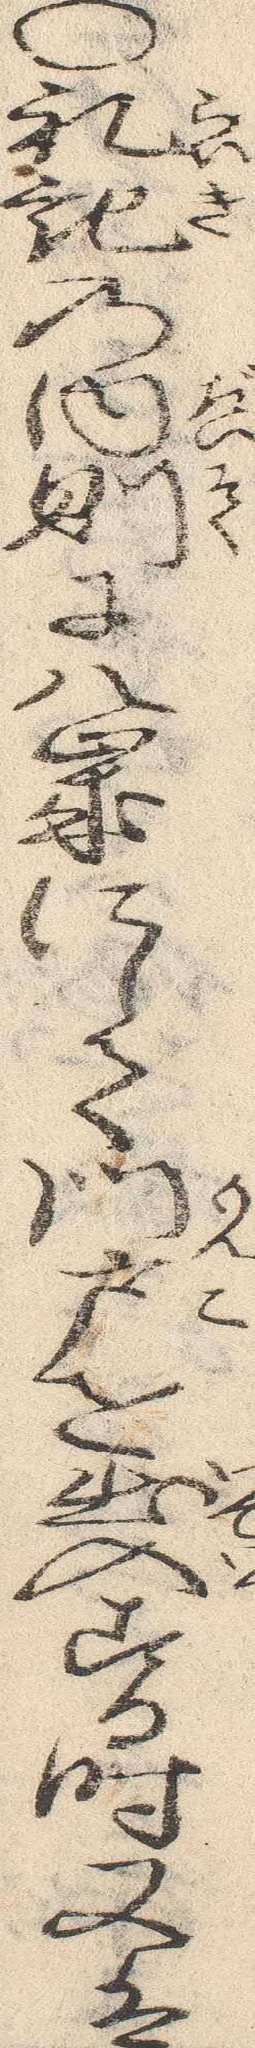○礼記の内則に八歳にして門戸を出入する時又は
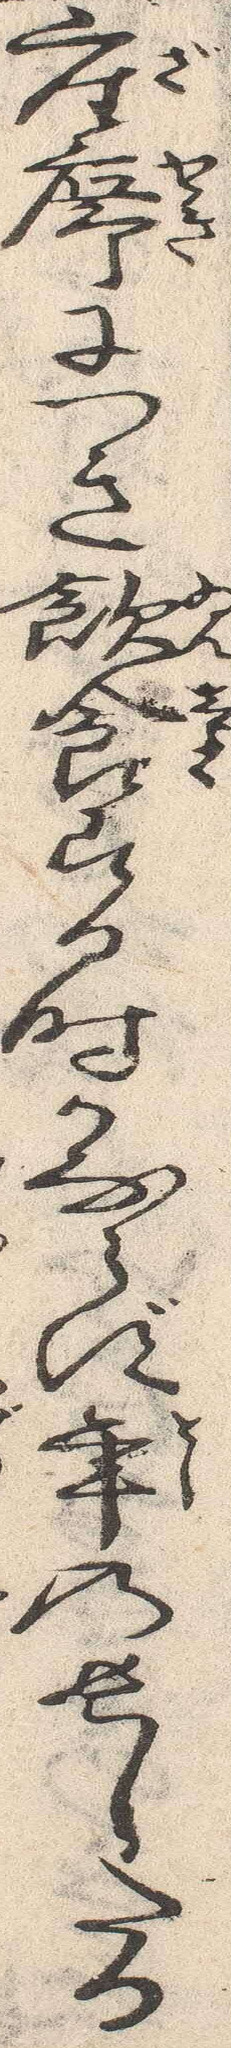座席につき飲食する時かならず年の長したる
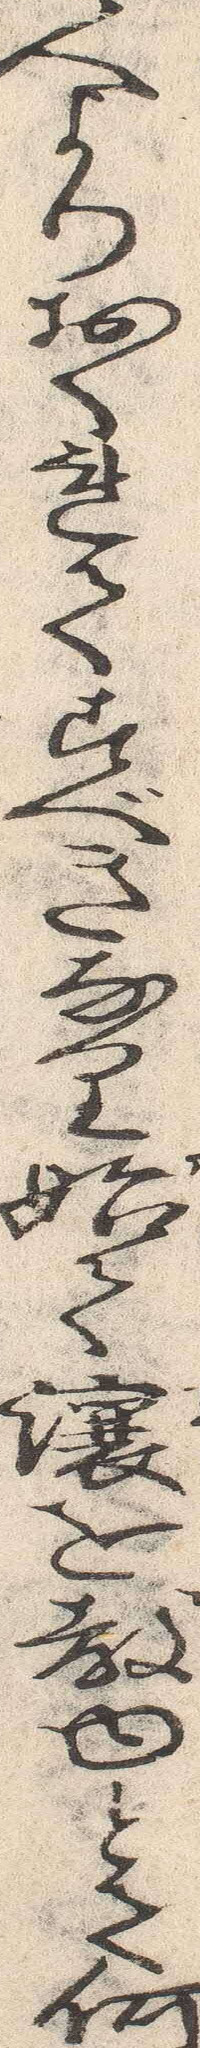人よりおくれてすべきなり始て譲を教ゆとて何
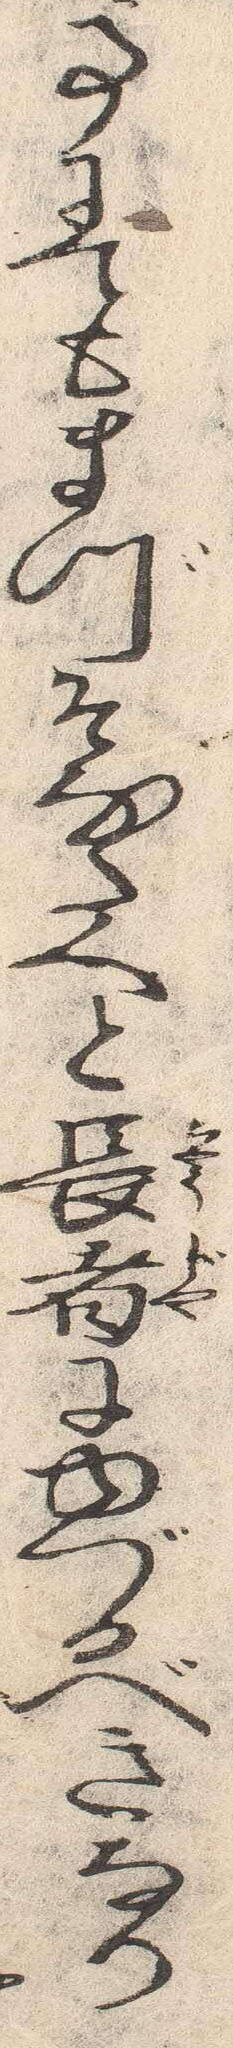事にてもまづそなたへと長者にゆづるべきなり
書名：小児必用養育草
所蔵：東京学芸大学附属図書館 国文学研究資料館
